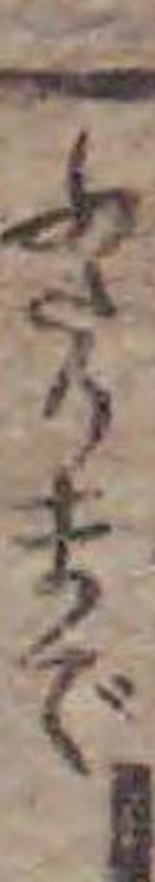ふたりまで
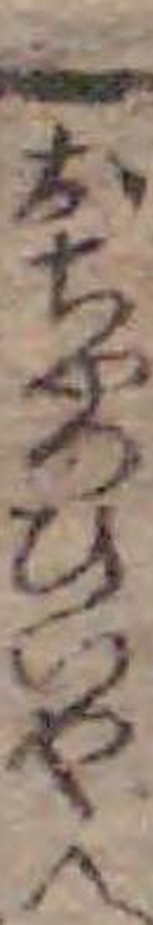おちやつひいや
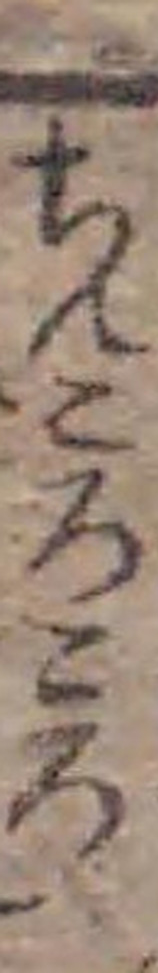ちんころころ
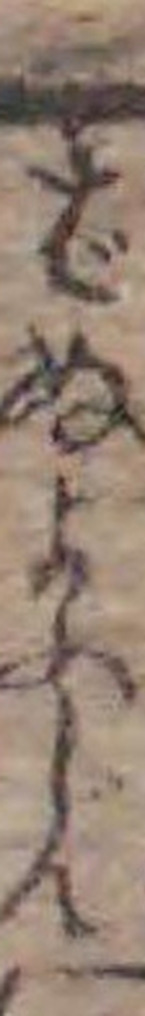ばぬよふじん
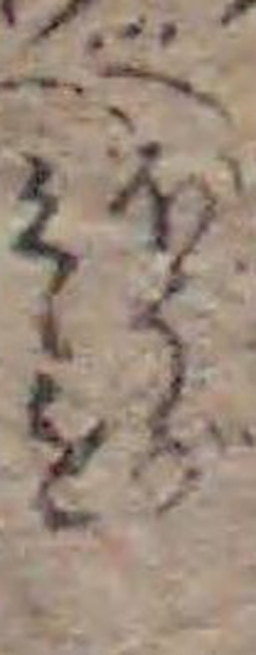みゝを
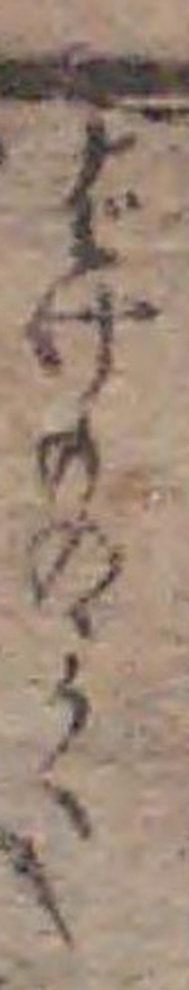ばけものゝかく

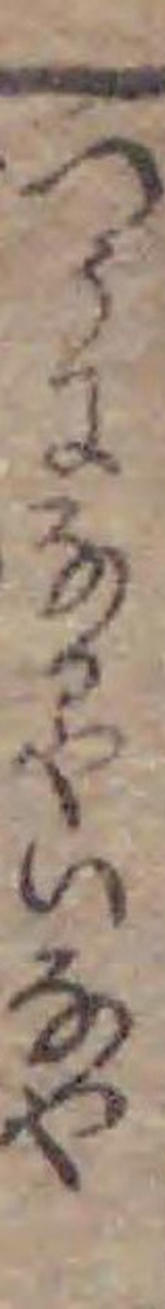つうになるやいなや
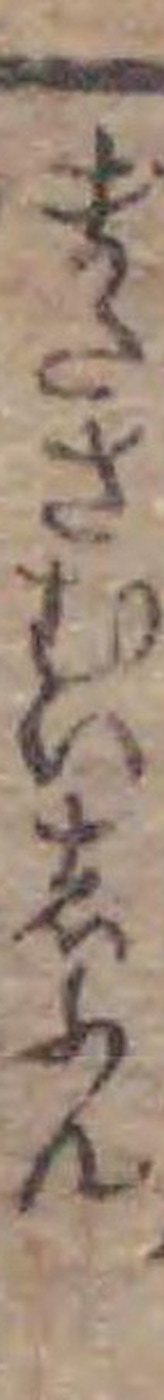またさむいしふん
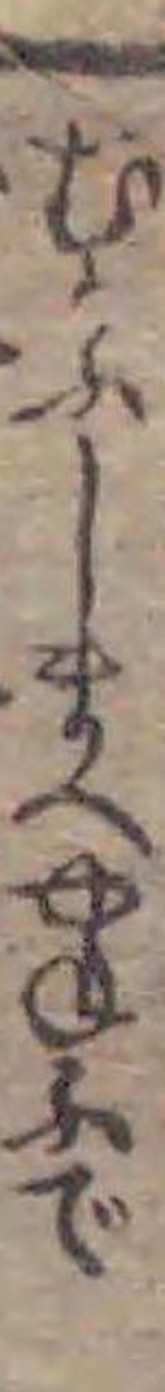むかふしまへやねふで
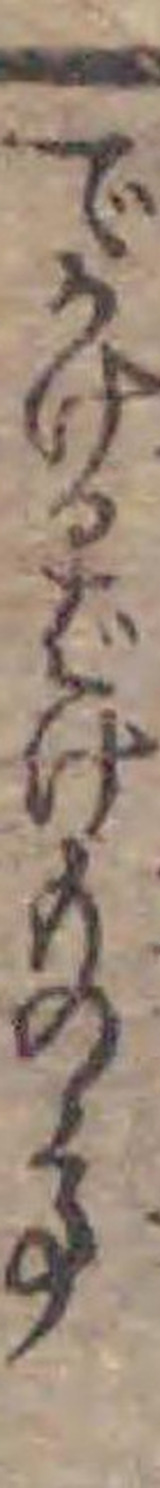でかけるばけものゝ事
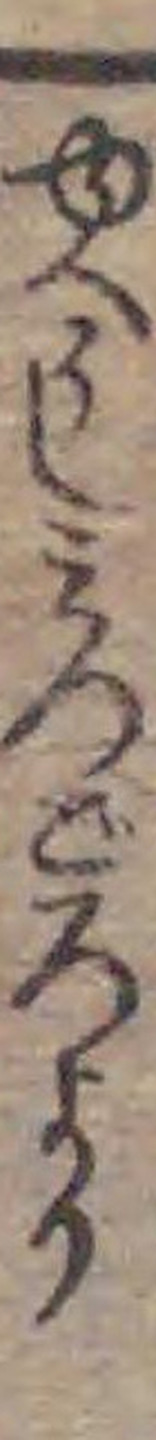ゆへうしみつごろより
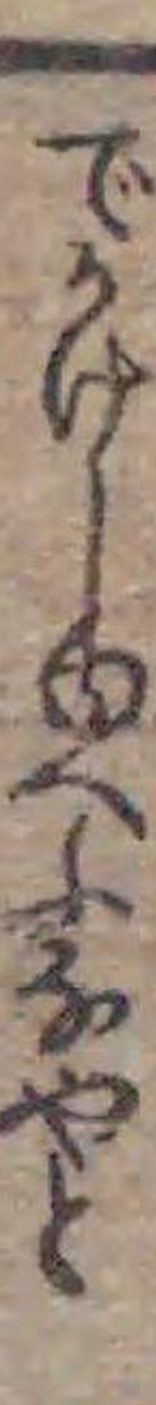でかけしゆへふなやと
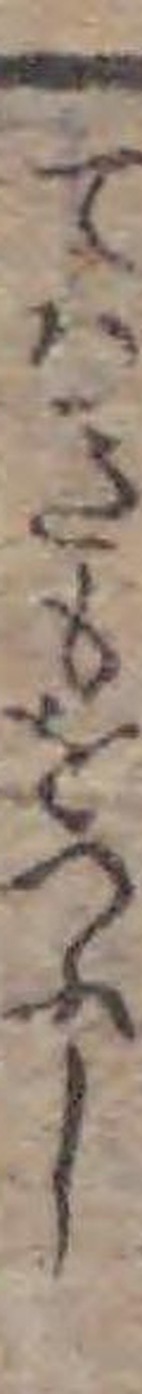てはきもをつふし
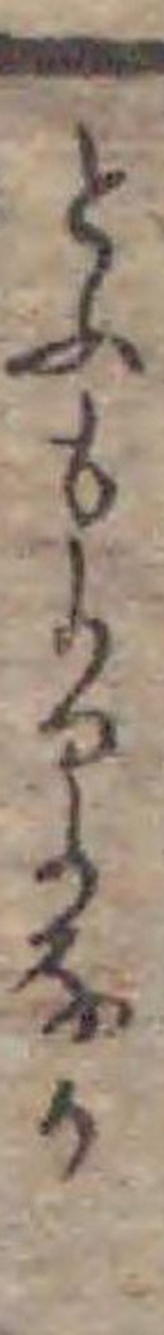とふもよるよなか
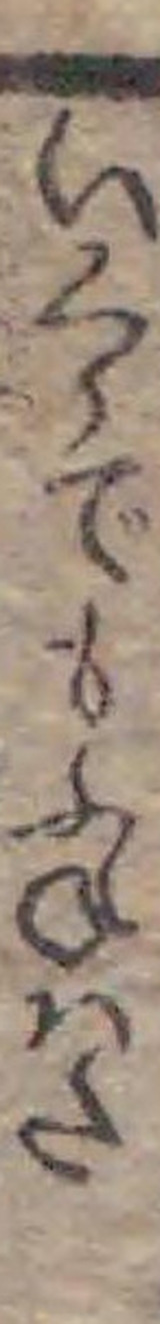いくらでもふねはた
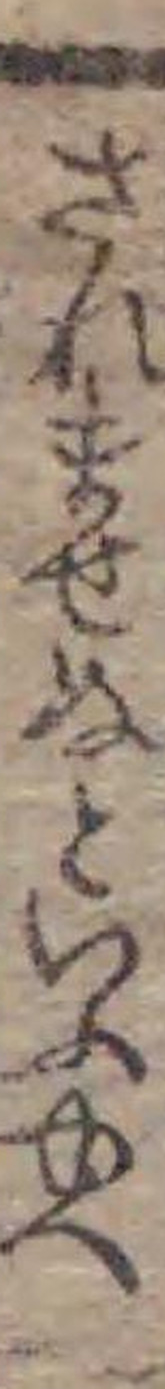されませぬといふゆへ
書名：化物楽屋異牒 : 2巻
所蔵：国立国会図書館 National Diet Library, JAPAN
